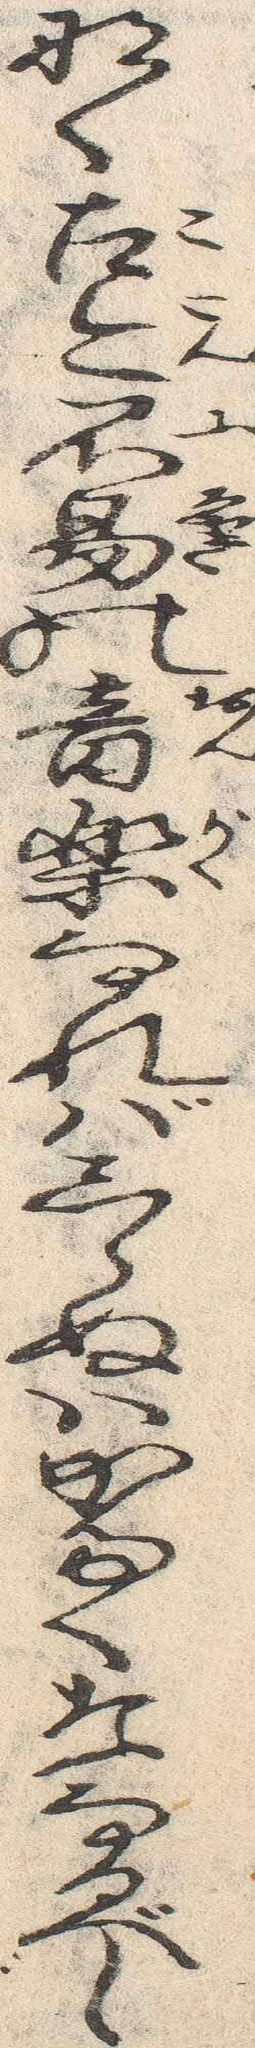なく古今不易の音楽なればしらぬはかたくななるべし
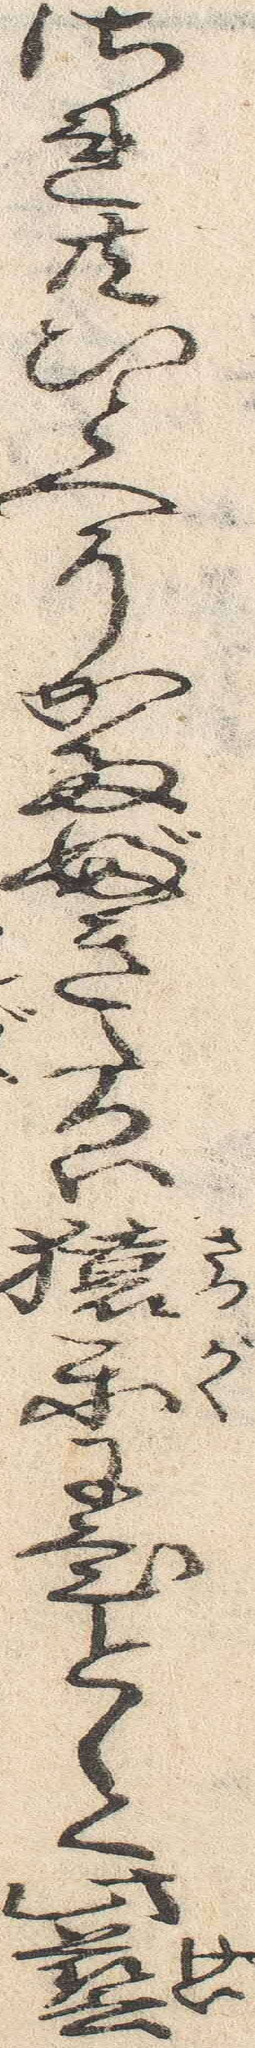され共ひとへにかたぶきたるは猿楽にひとしく此芸
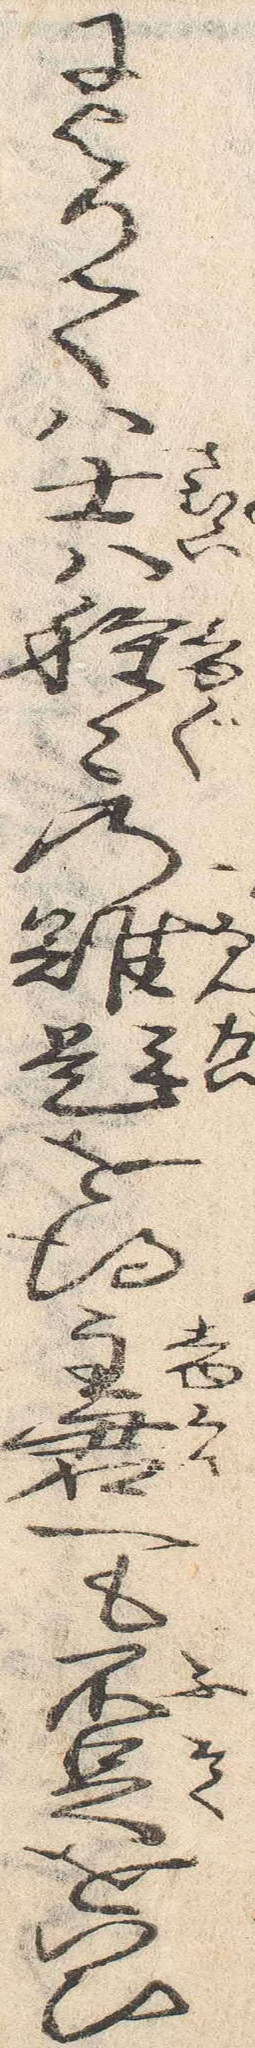によりては士は種々の難題を得主君へも不足をいひ
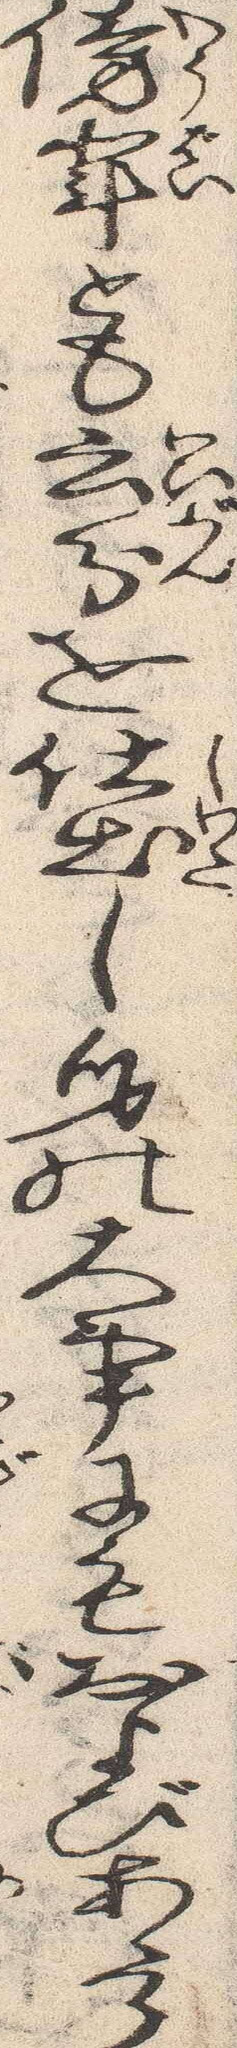傍輩とも云分を仕出し身の大事にもおよびあたら
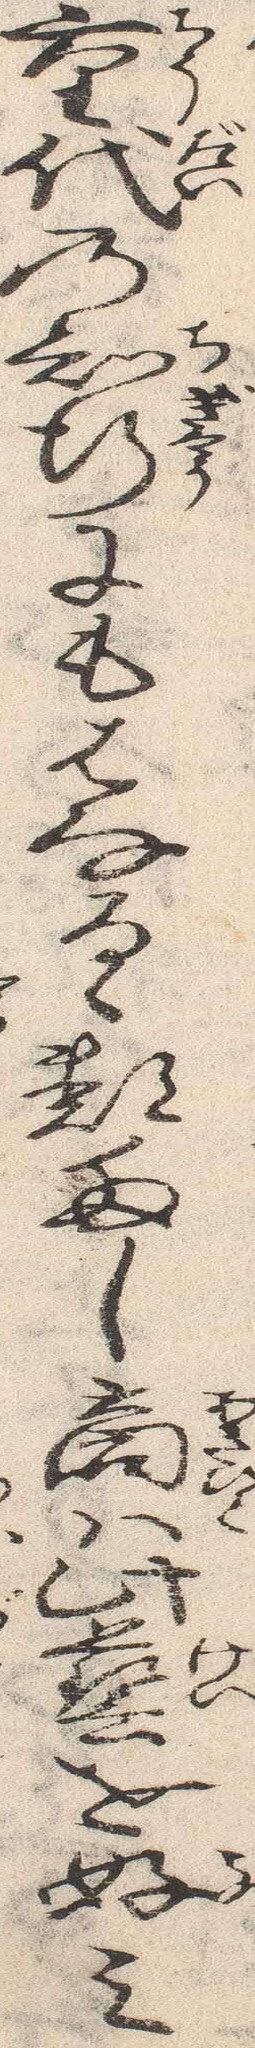重代の知行にもはなるゝ類多し商は此芸を好み
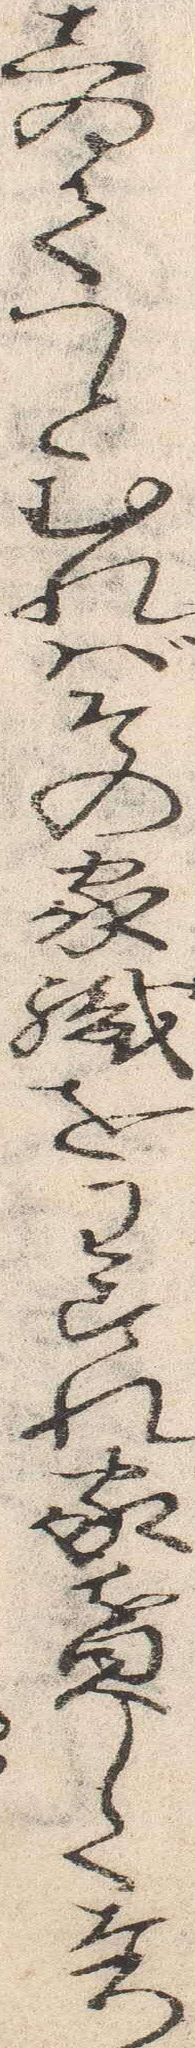しゐてつとむればその家職をわすれ家貧なり
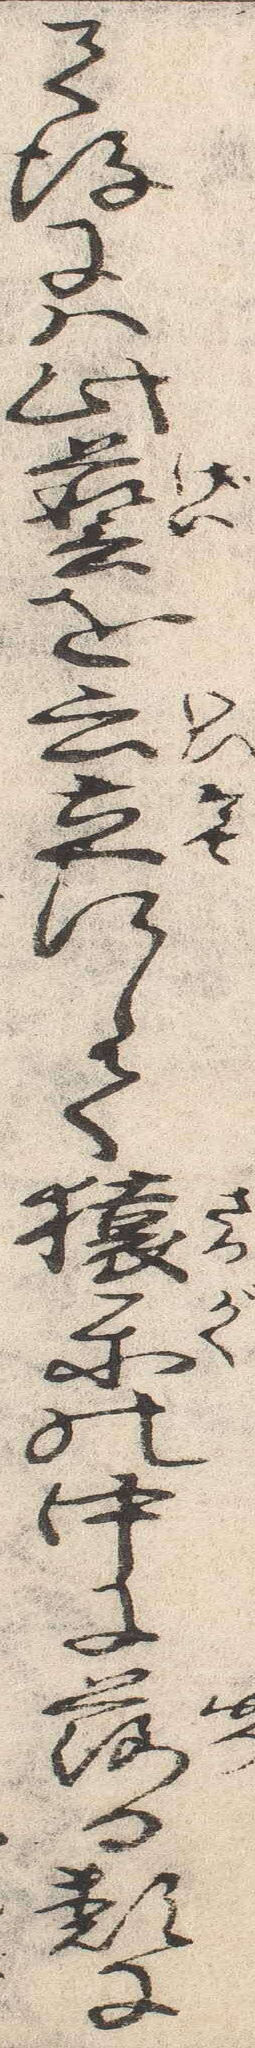て後には此芸を云立にして猿楽の中に落る類に
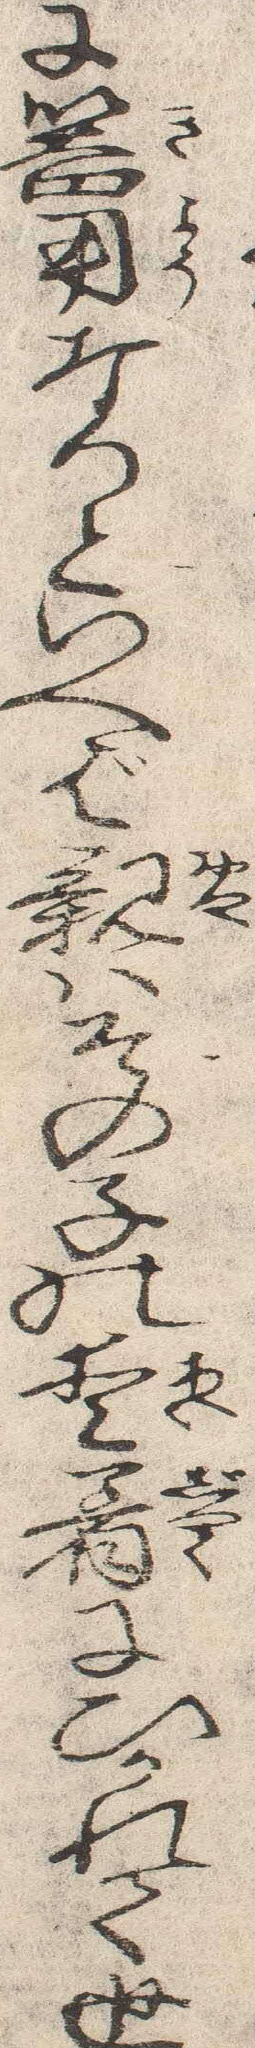いたる器用なりといへば親はその子の愛着にひかれて世
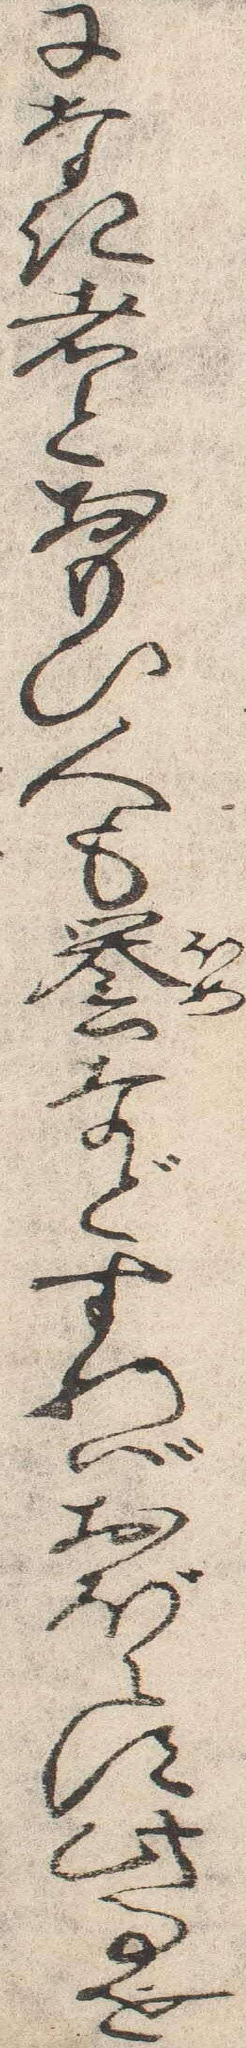になき者とおもひ人も誉などすればおぼえす此事を
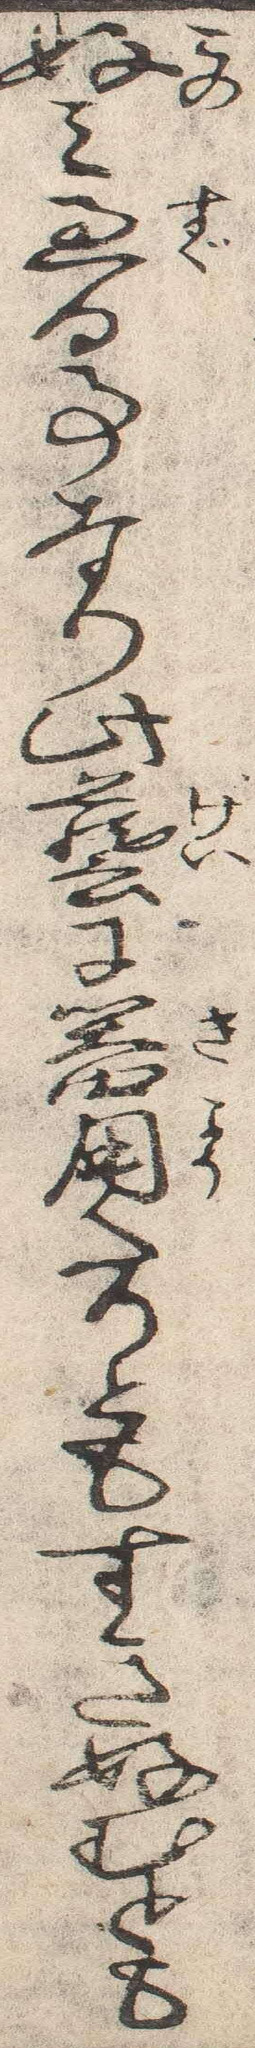好み過る事なり此芸に器用たりともすき好むとも
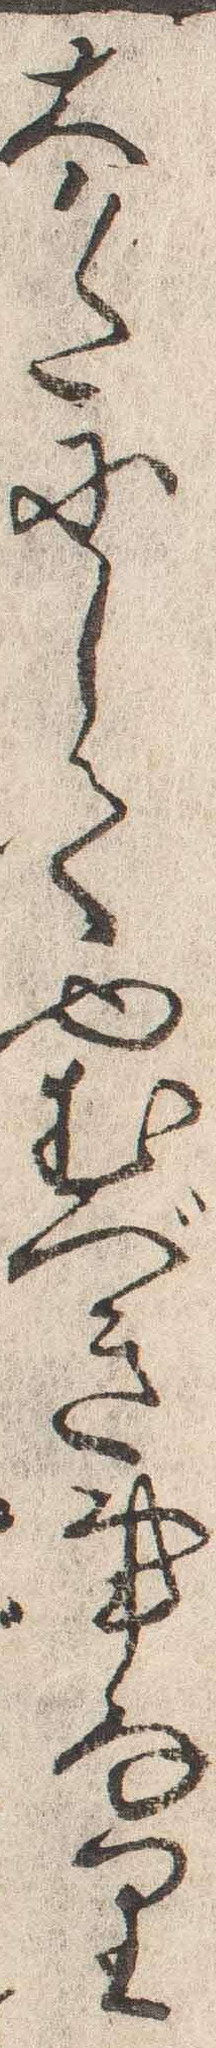大かたにしてやむべき事なり
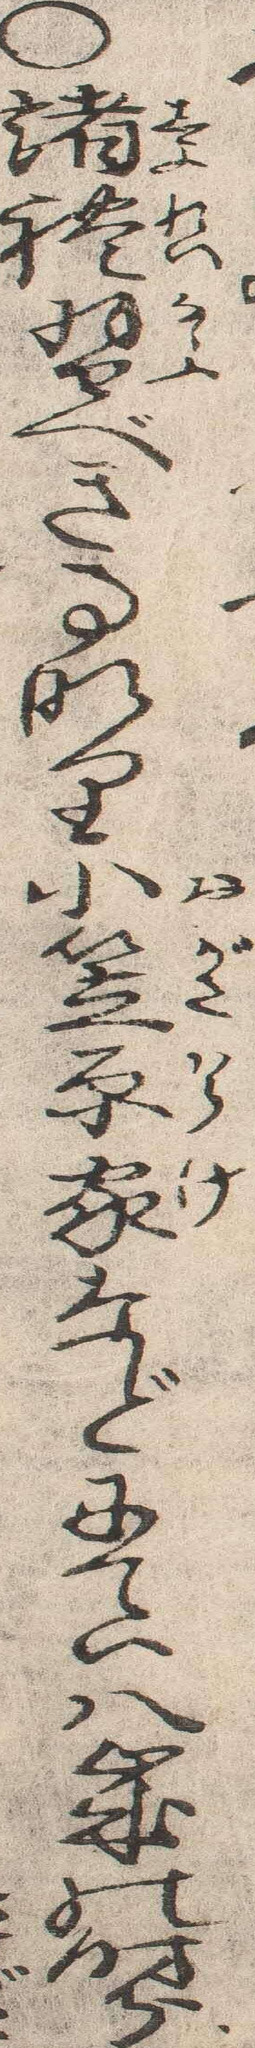○諸礼習べき事なり小笠原家などにては八歳の時分
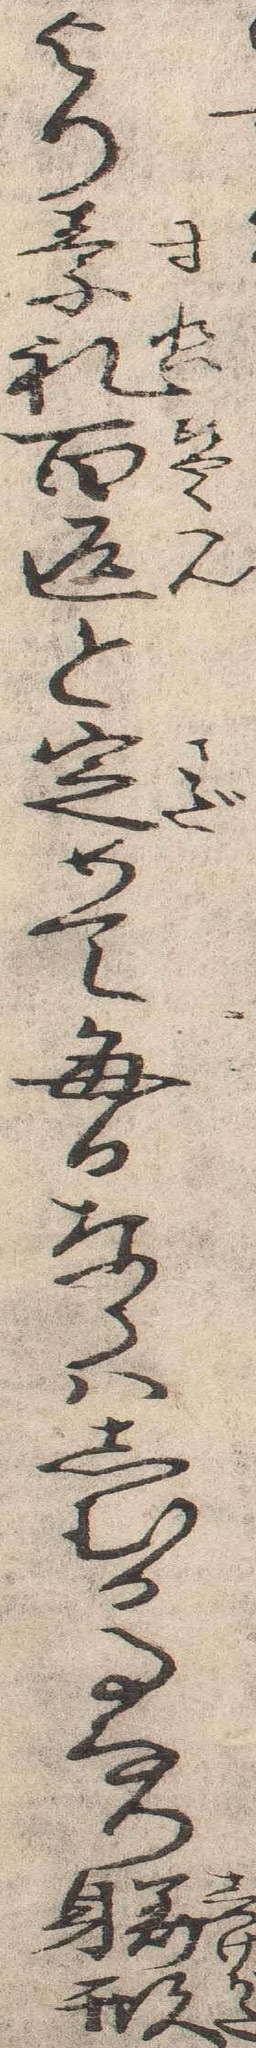より素礼百返と定めて毎日ならはしむる事なり躾形

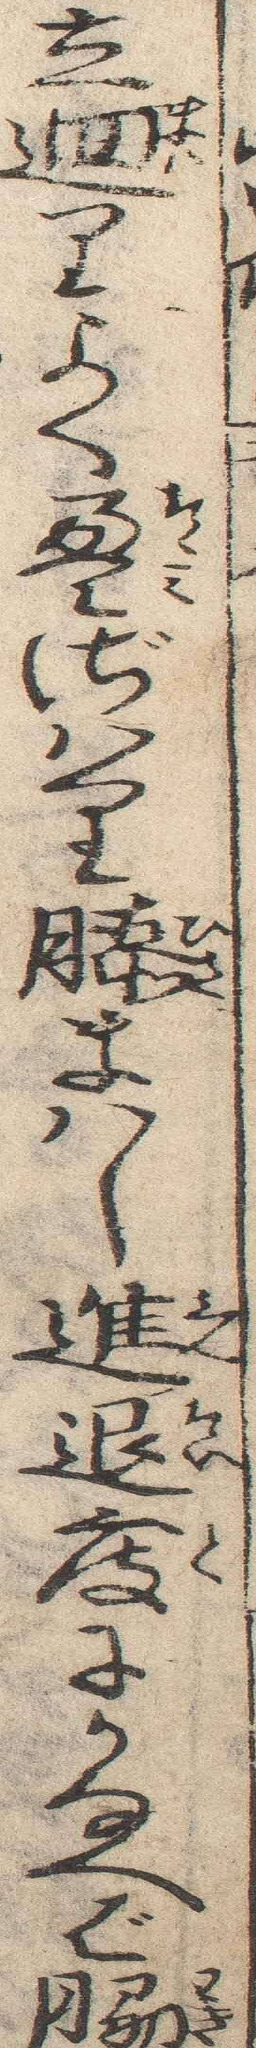立廻りよく畳ざはり膝まはし進退度にかなへば脇
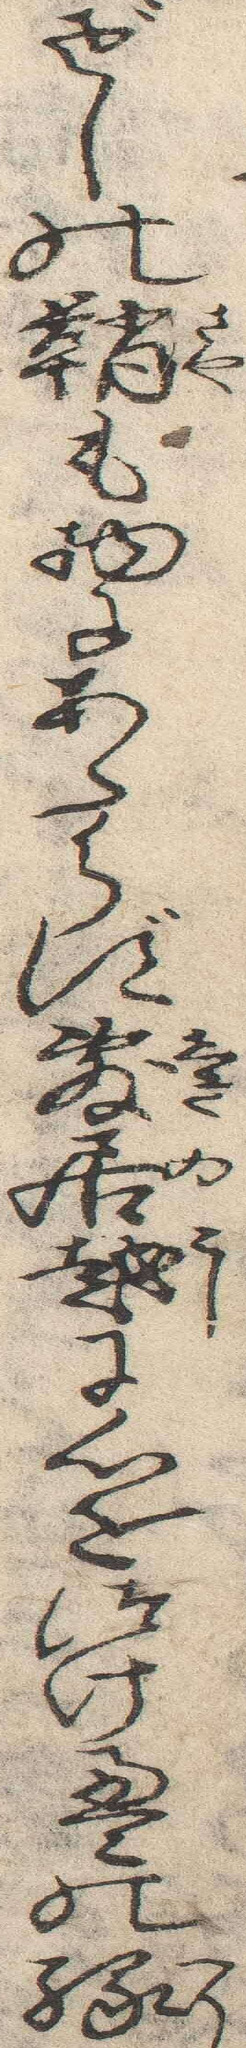ざしの鞘も物にあたらず敷居越に心をつけ畳の縁
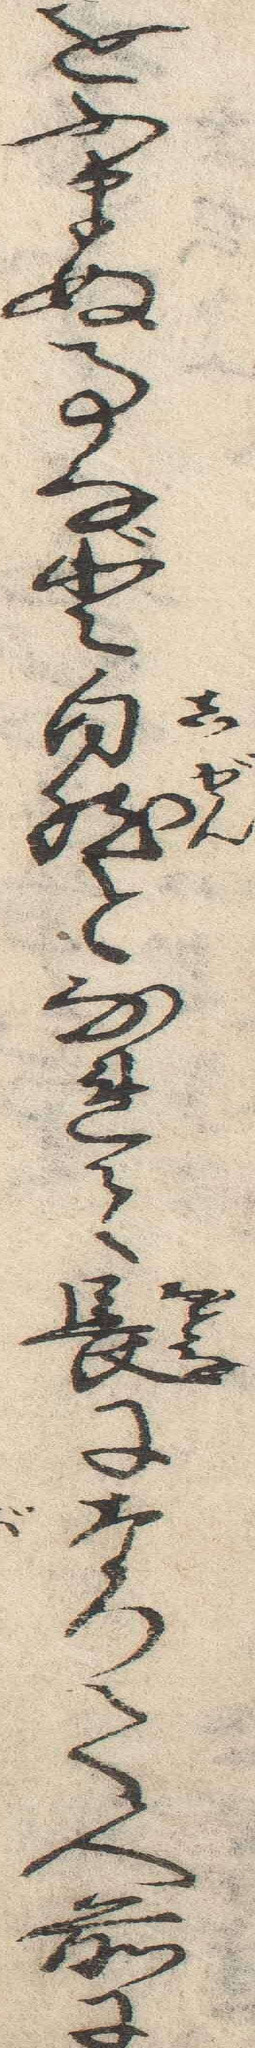をふまぬ事など自然となれて長になりて人前に
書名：小児必用養育草
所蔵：東京学芸大学附属図書館 国文学研究資料館
